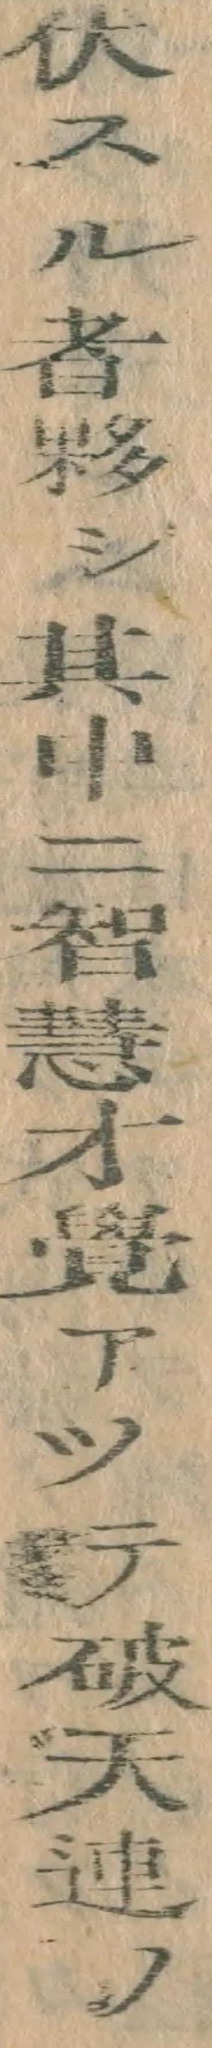伏スル者夥シ其中ニ智慧才覚アツテ破天連ノ
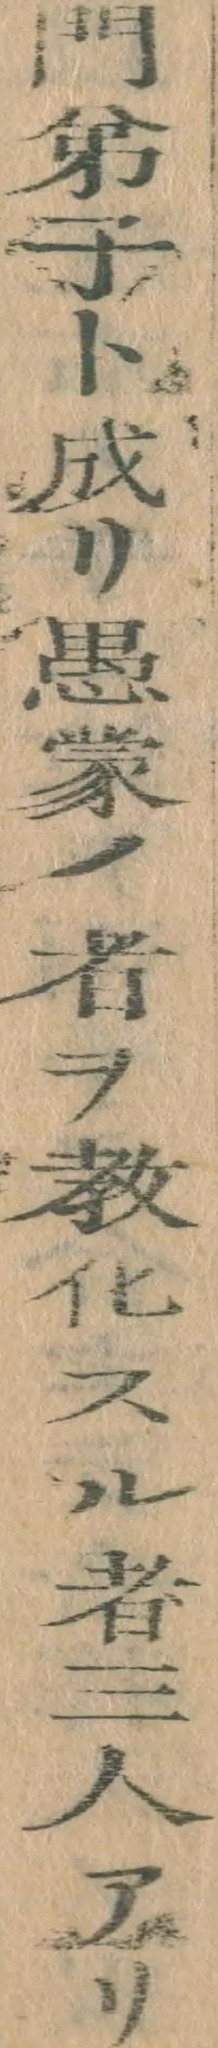門弟子ト成リ愚蒙ノ者ヲ教化スル者三人アリ
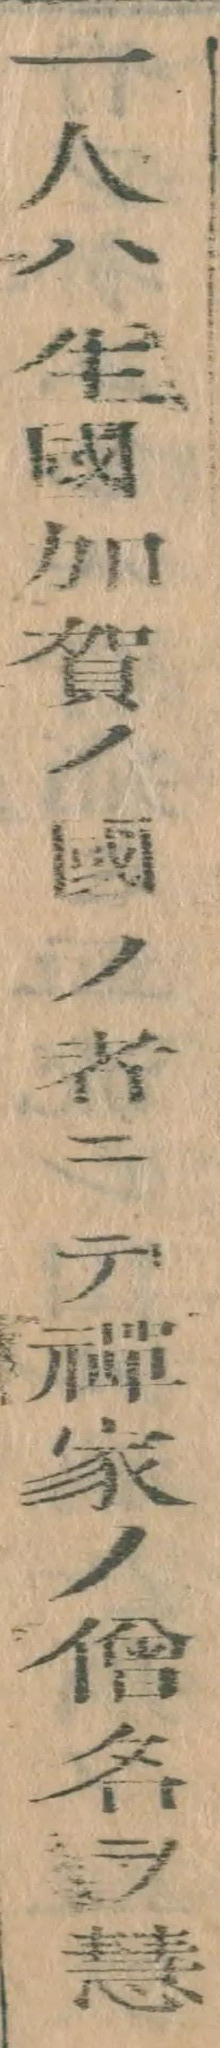一人ハ生国加賀ノ国ノ者ニテ禅家ノ僧名ヲ慧
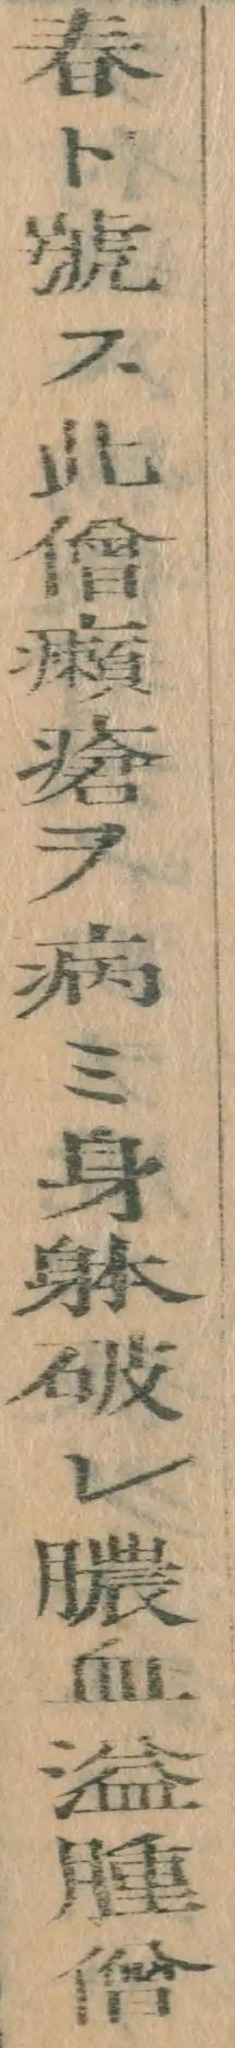春ト号ス此僧癩瘡ヲ病ミ身体破レ膿血溢腫僧
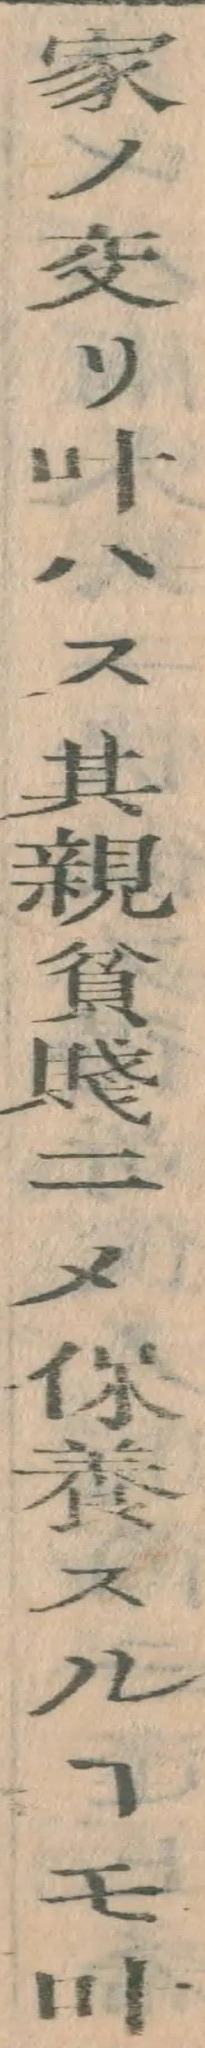家ノ交リ叶ハス其親貧賤ニシテ保養スルヿモ叶
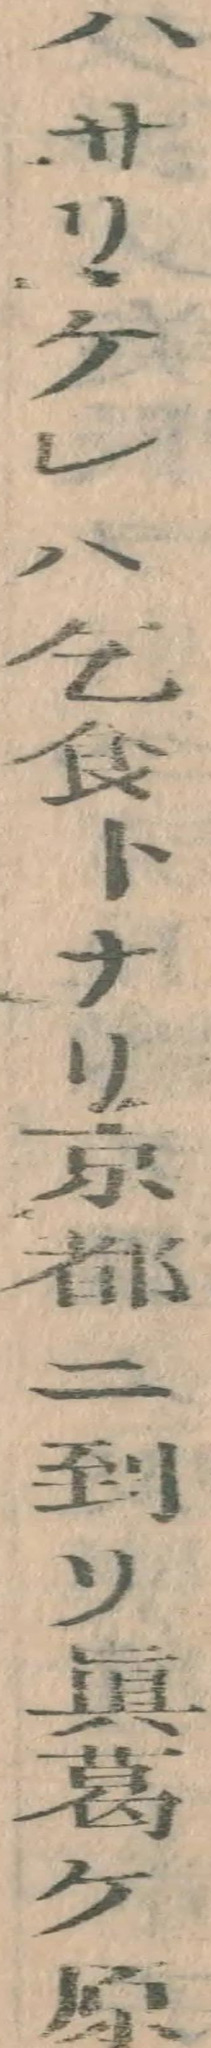ハサリケレハ乞食トナリ京都ニ到リ真葛ケ原
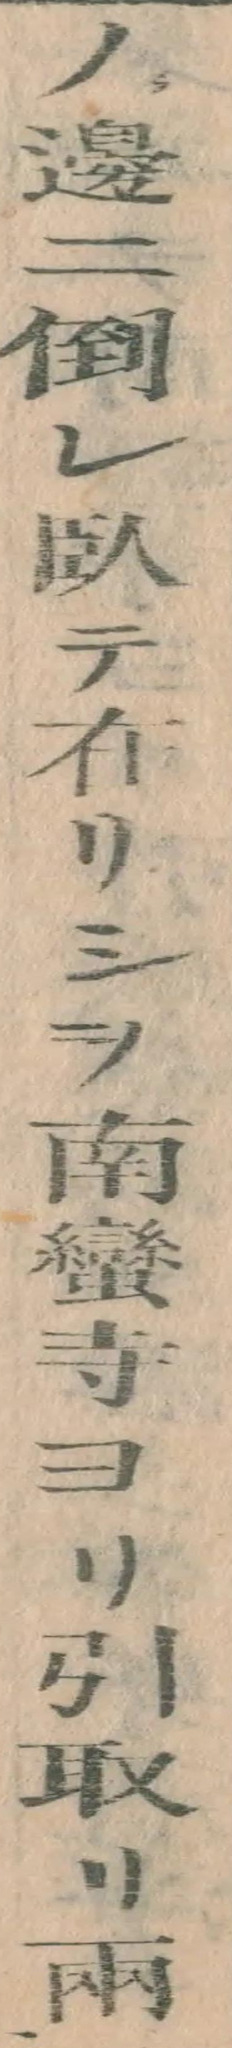ノ辺ニ倒レ卧テ在リシヲ南蛮寺ヨリ引取リ両
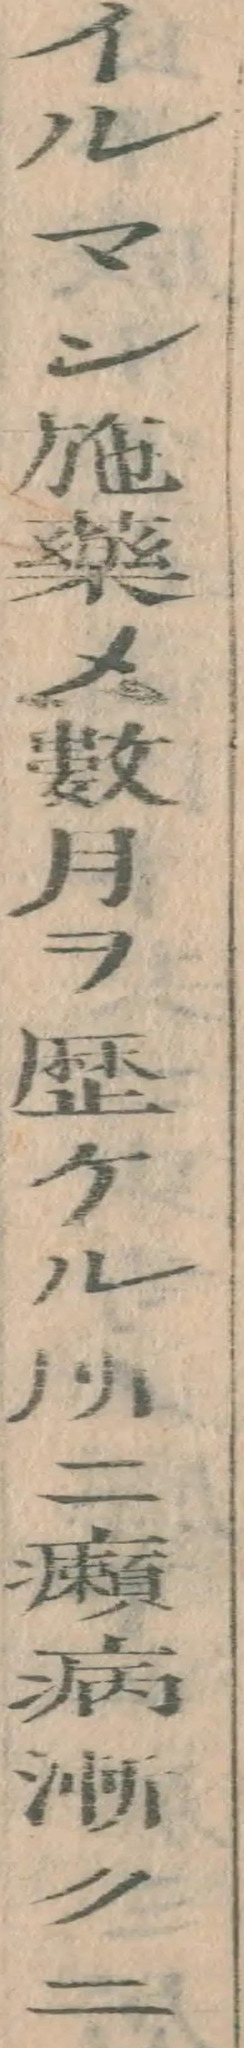イルマン施薬シテ数月ヲ歴ケル所ニ癩病漸クニ
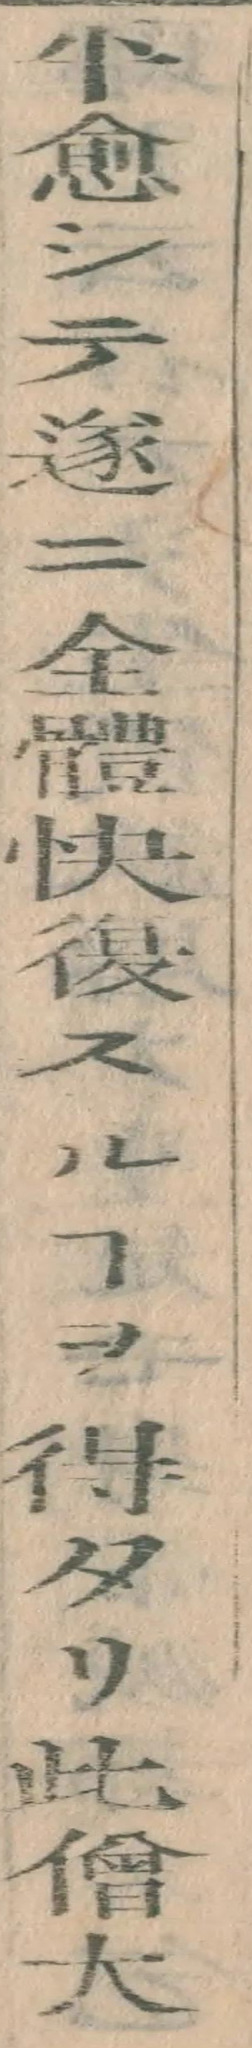平愈シテ遂ニ全体快復スルヿヲ得タリ此僧大
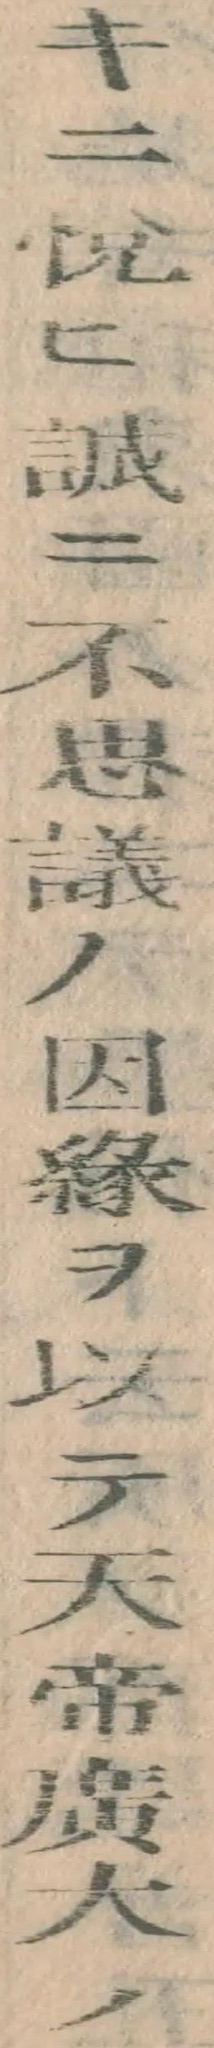キニ悦ヒ誠ニ不思議ノ因緣ヲ以テ天帝広大ノ
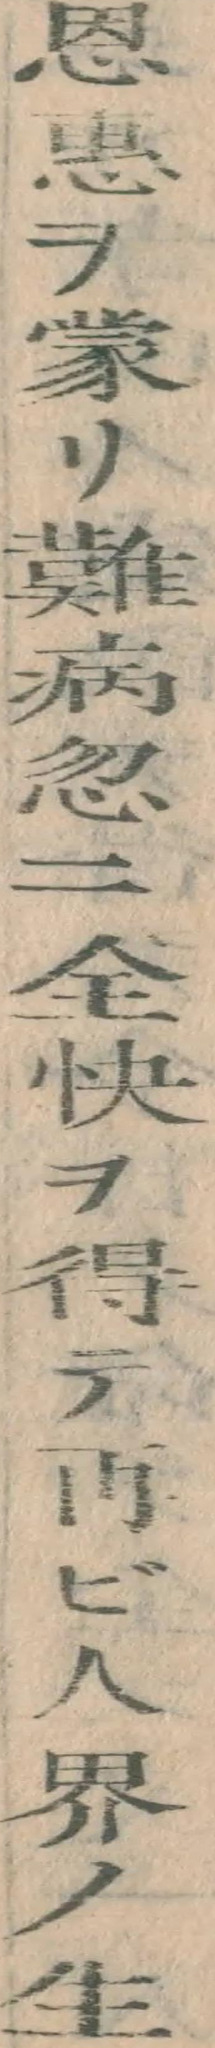恩恵ヲ蒙リ難病忽ニ全快ヲ得テ再ビ人界ノ生
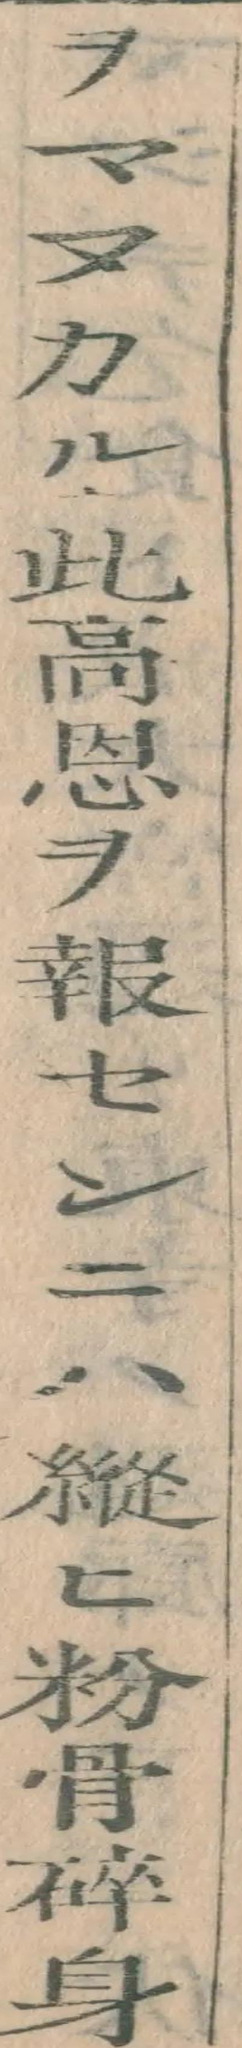ヲマヌカル此高恩ヲ報センニハ縦ヒ粉骨砕身
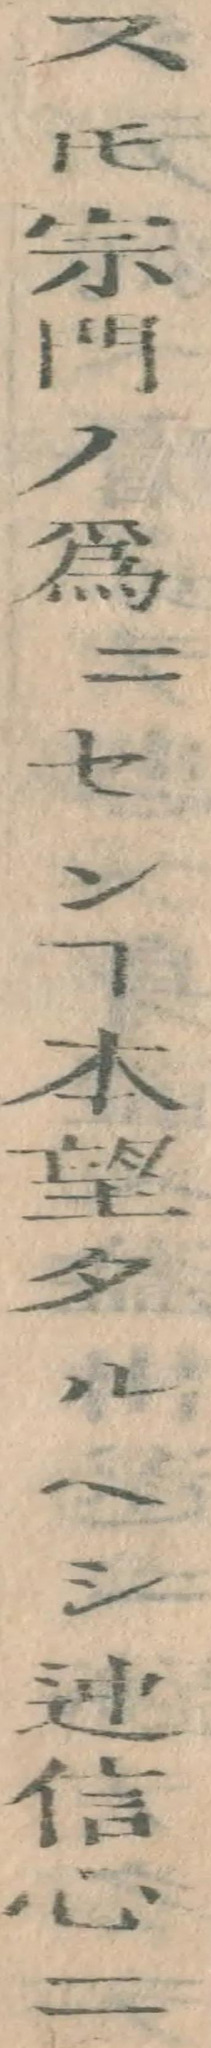ストモ宗門ノ為ニセンヿ本望タルヘシ迚信心ニ
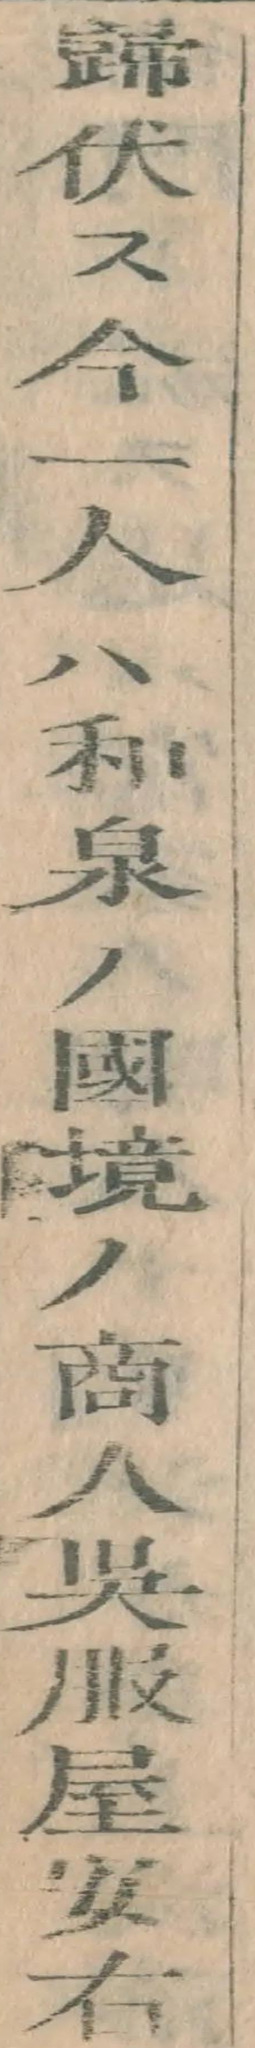帰伏ス今一人ハ和泉ノ国境ノ商人吳服屋安右

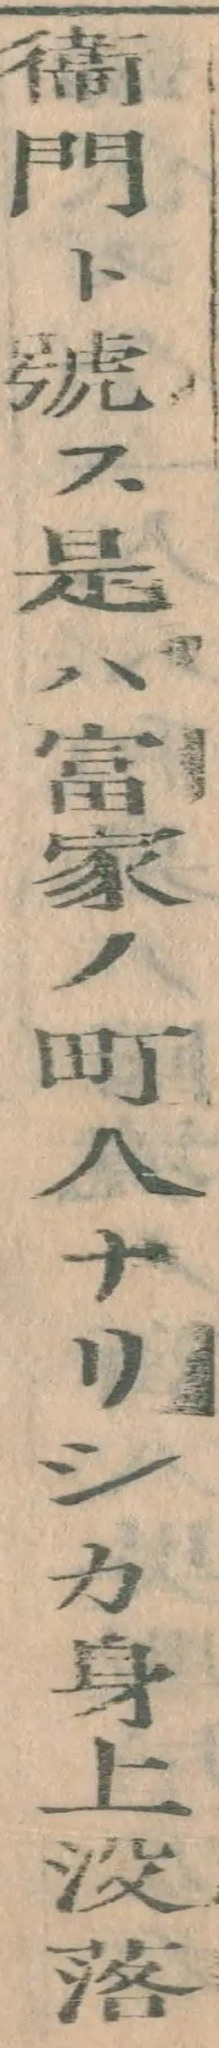衛門ト号ス是ハ富家ノ町人ナリシカ身上没落
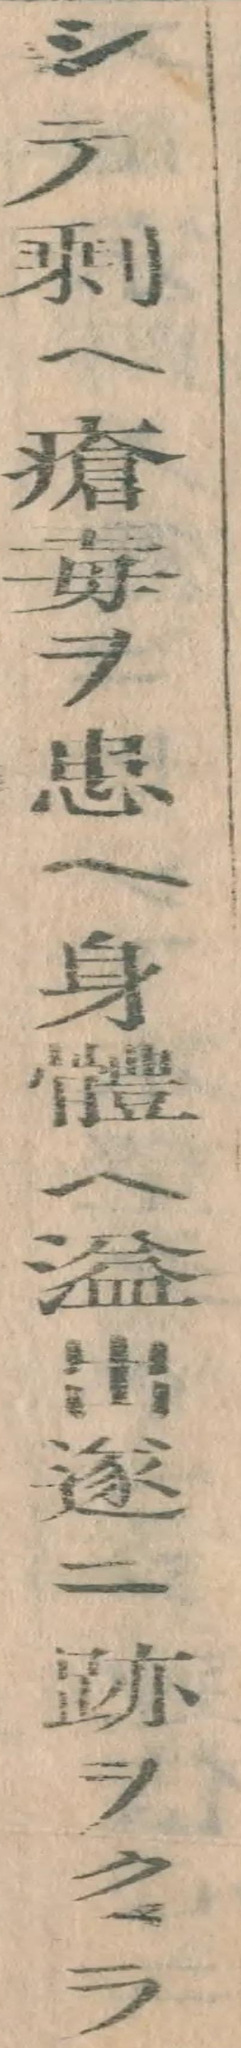シテ剰ヘ瘡毒ヲ患ヘ身体ヘ溢出遂ニ跡ヲクラ
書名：南蛮寺興廃記
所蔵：国立国会図書館 National Diet Library, JAPAN
